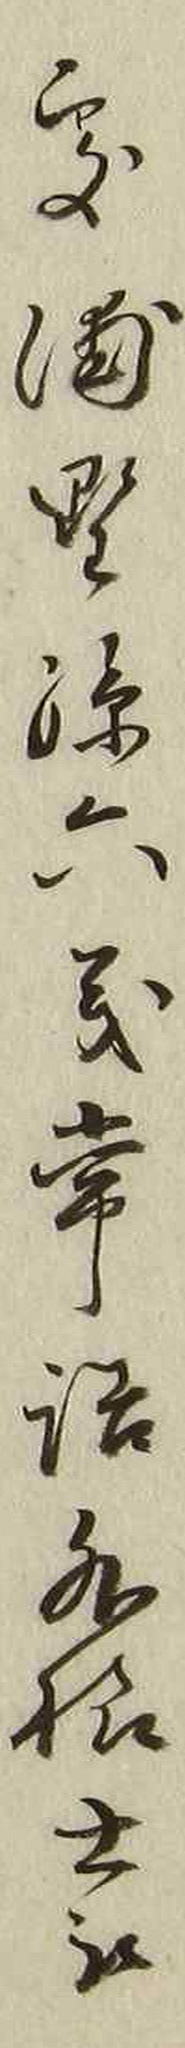処浦野孫六義常詰外様士被
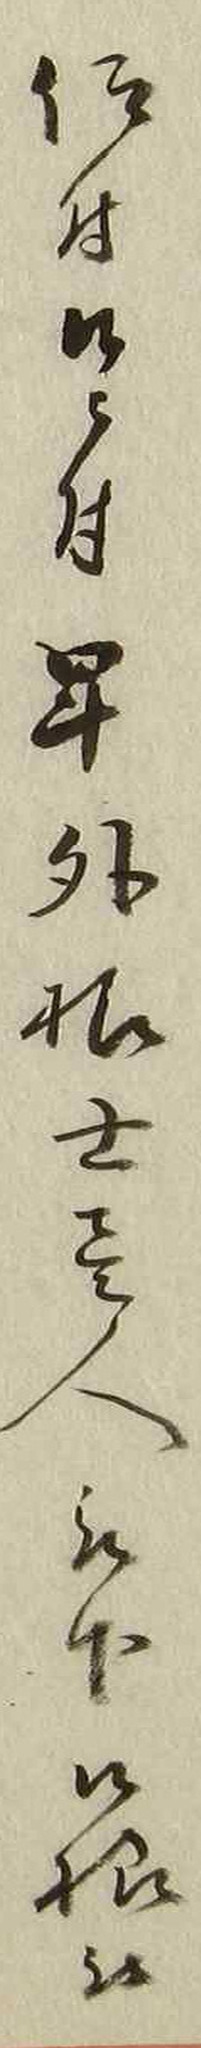仰付候ニ付外様士壱人被下候様被
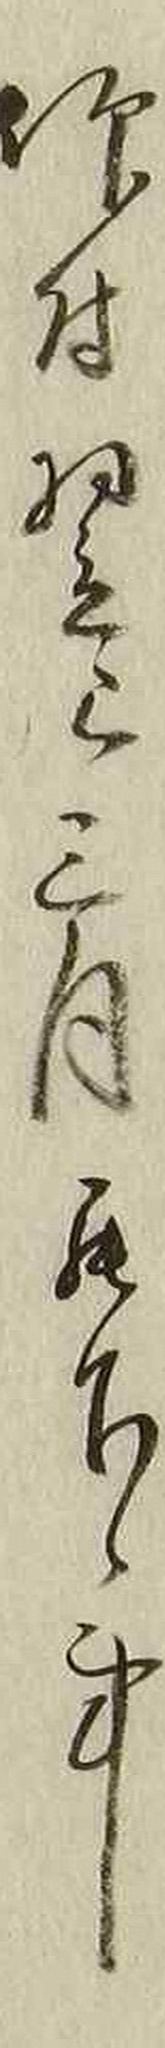仰付翌巳三月罷下候事
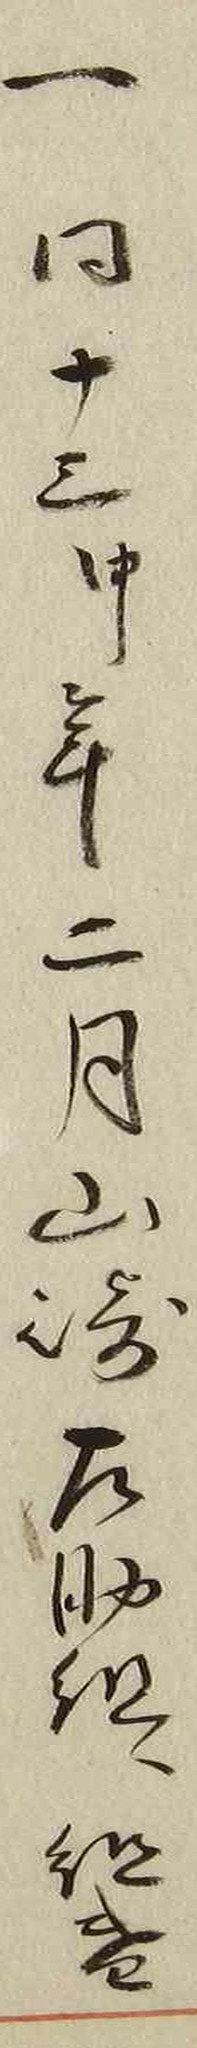一同十三申年二月山崎左助組へ組替
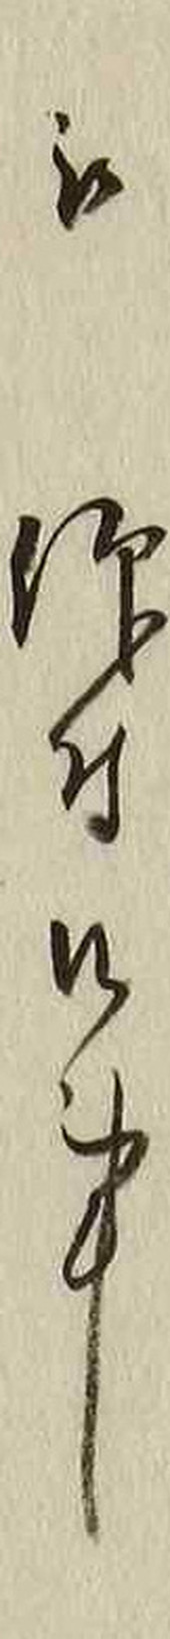被仰付候事
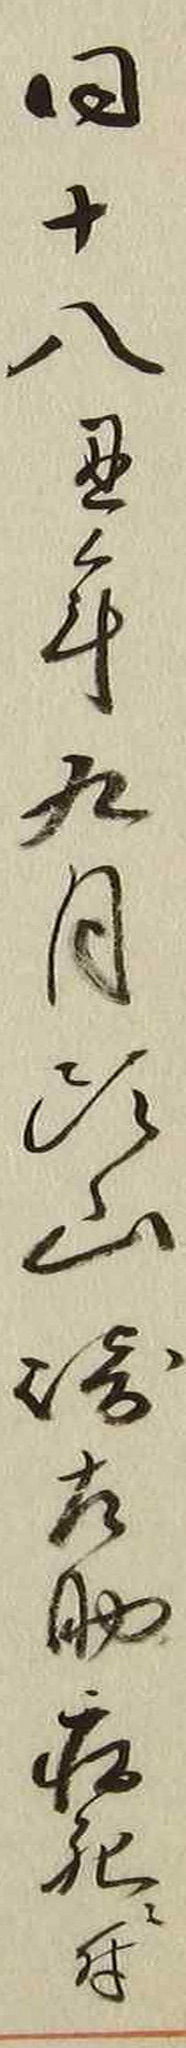同十八丑年九月頭山崎左助病死ニ付
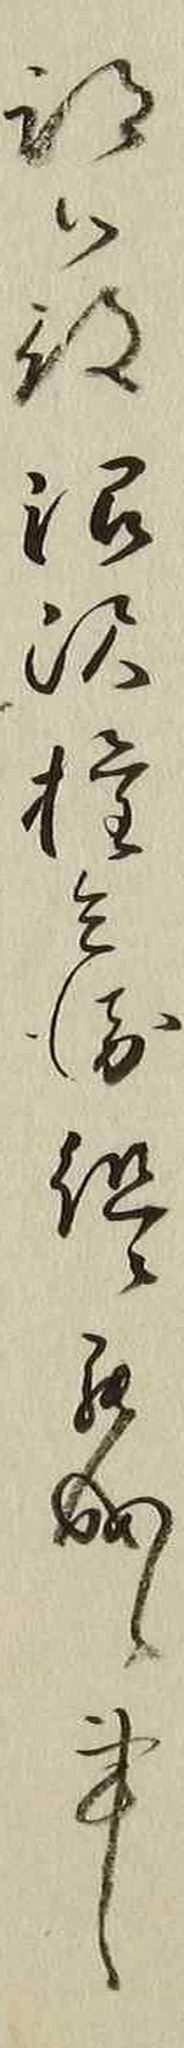跡御役沼沢権兵衛組ニ罷成候事
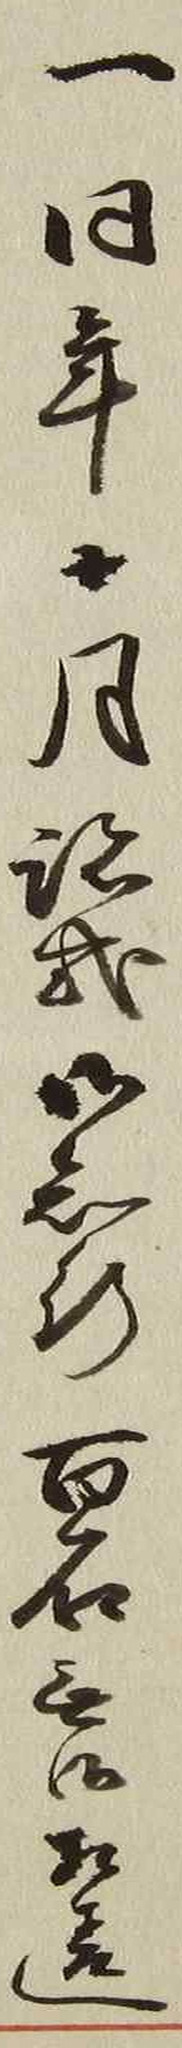一同年十月跡式御知行百石無御相違
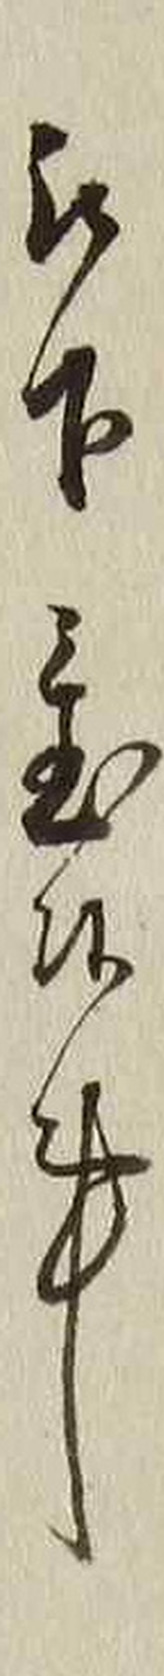被下置候事
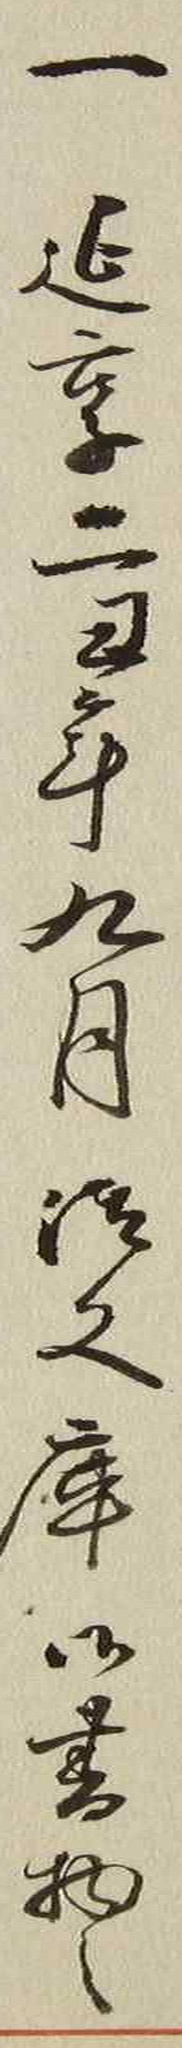一延享二丑年九月御文庫御書物之
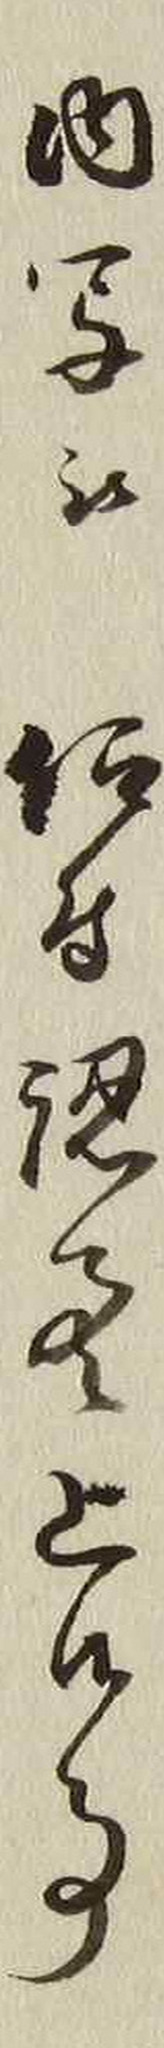内写被仰付認上候事
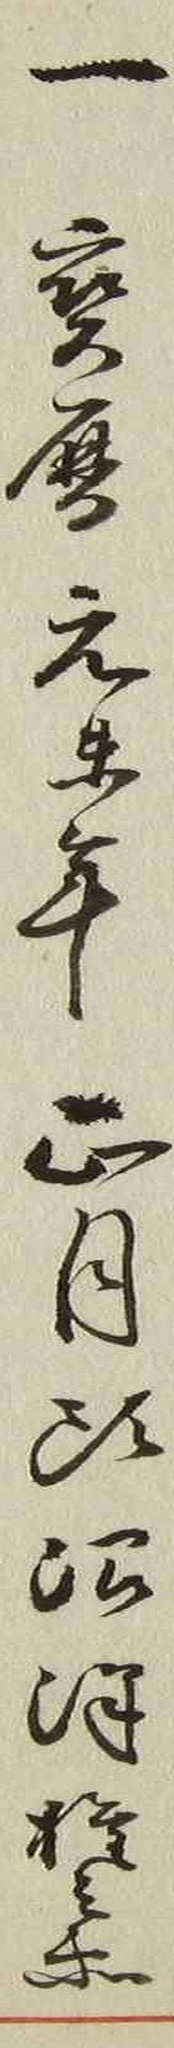一宝暦元未年正月頭沼沢権兵衛
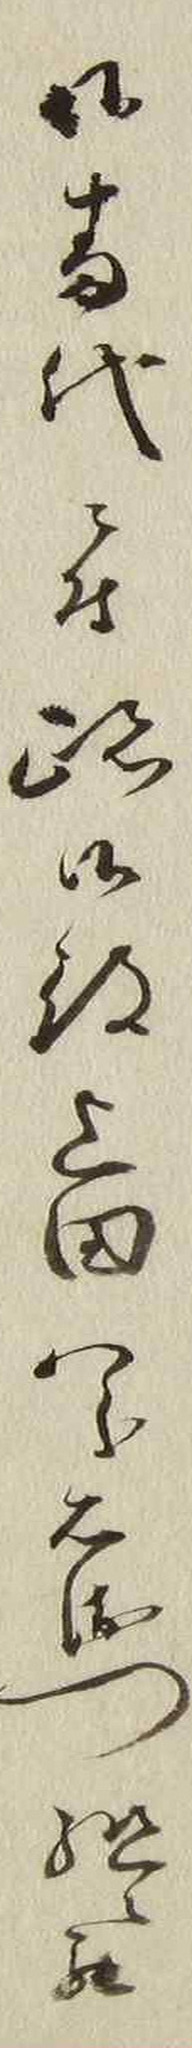御番代ニ付跡御役上田八郎右衛門組ニ罷
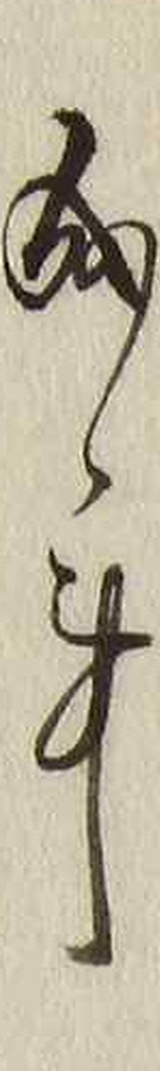成候事
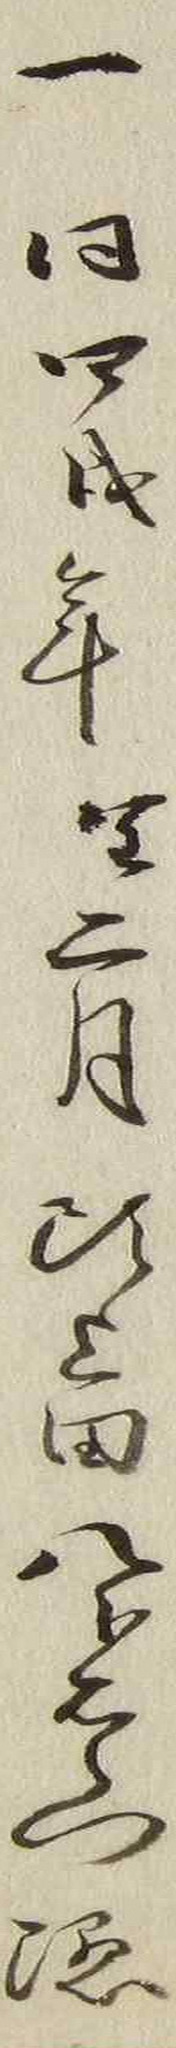一同四戌年閏二月頭上田八郎右衛門隠
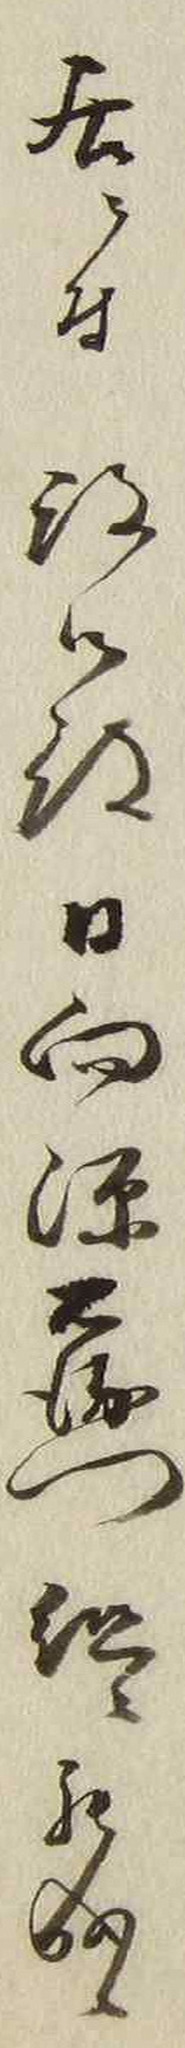居ニ付跡御役日向孫右衛門組ニ罷成候
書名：諸士系譜　巻之26　い之部26
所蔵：会津若松市立会津図書館
